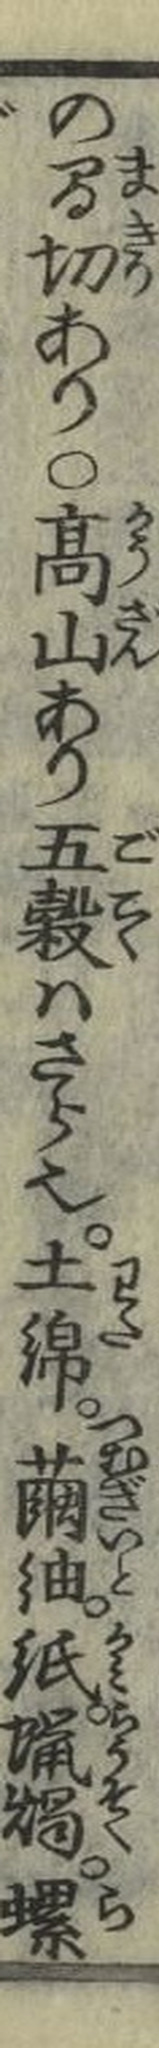の間切あり○高山あり五穀はさら也。土綿。繭紬。紙。蝋燭。螺
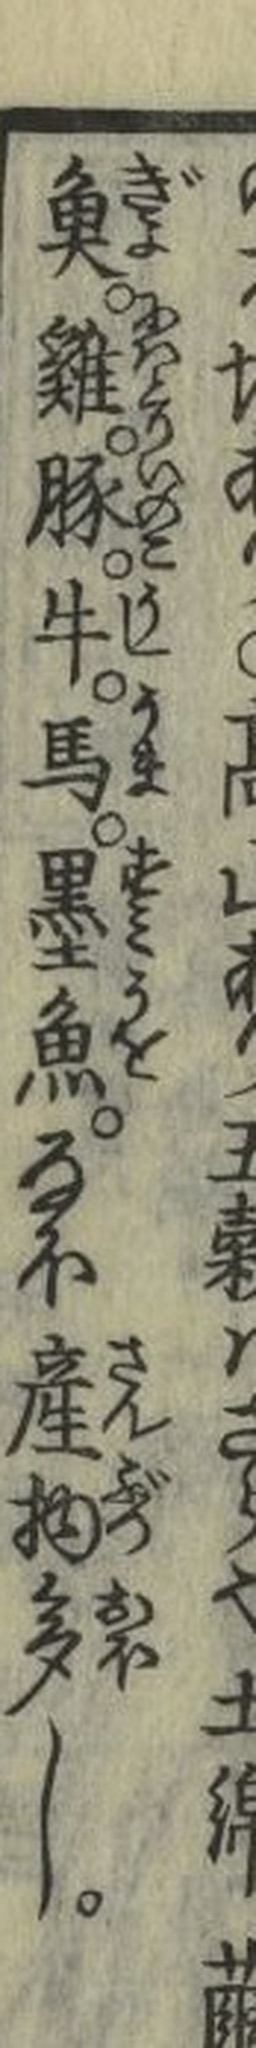魚。雞。豚。牛。馬。墨魚。なほ産物多し。

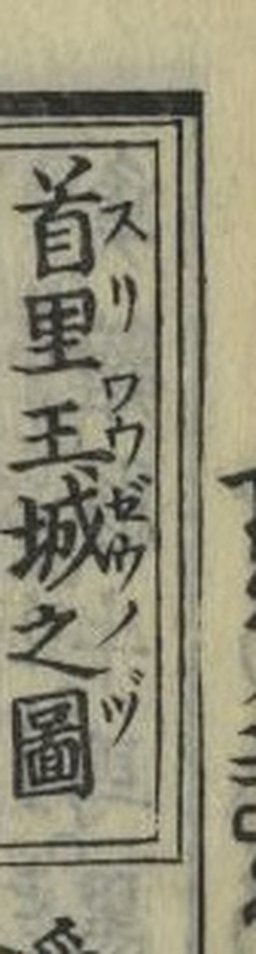首里王城之図
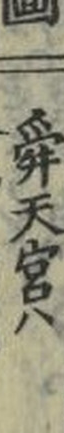舜天宮ハ
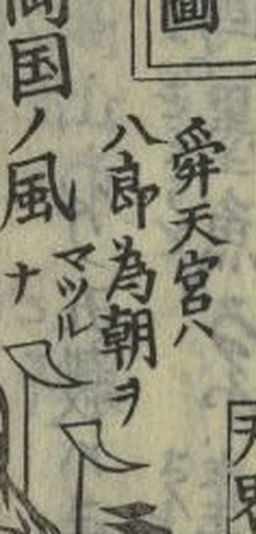八郎為朝ヲ
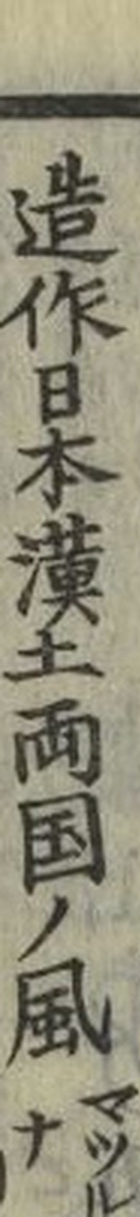造作日本潢土両国ノ風
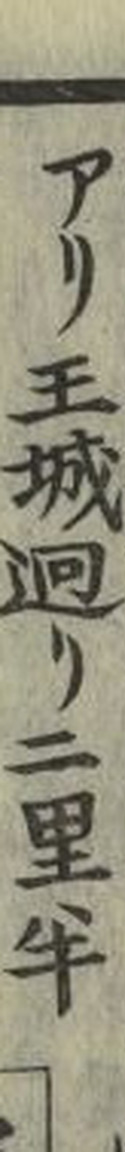アリ王城廻二里半
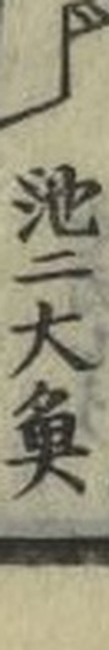池ニ大魚
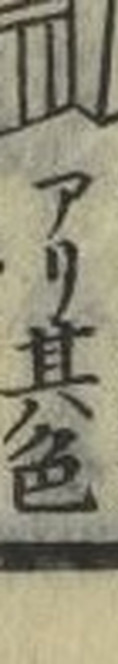アリ其色
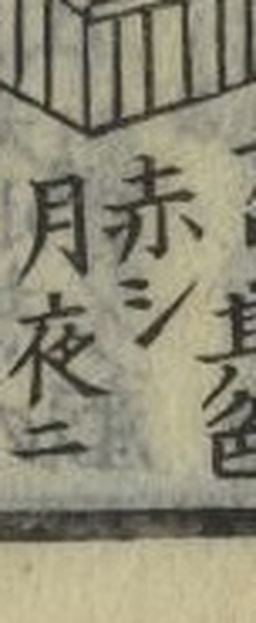月夜ニ
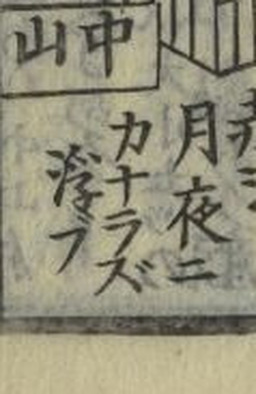カナラズ
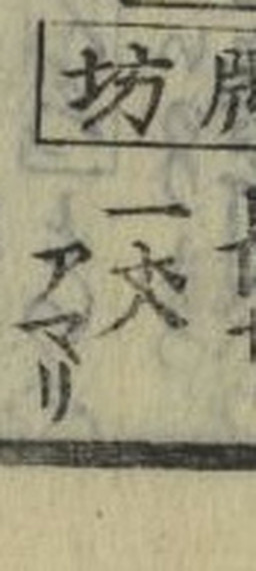アマリ
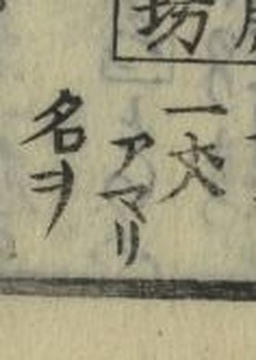アマリ
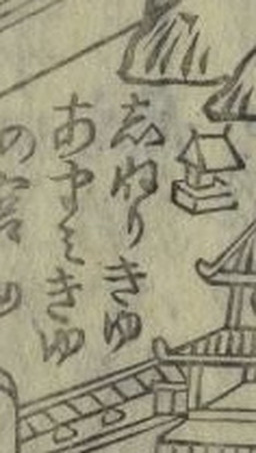しねりきゆ
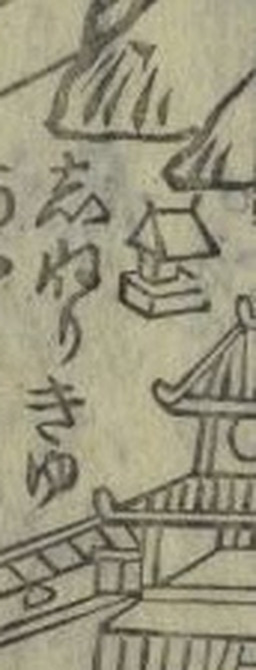しねりきゆ
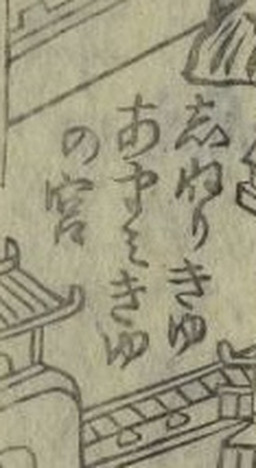あまみきゆ
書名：琉球奇譚
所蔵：University of the Ryukyus Library
